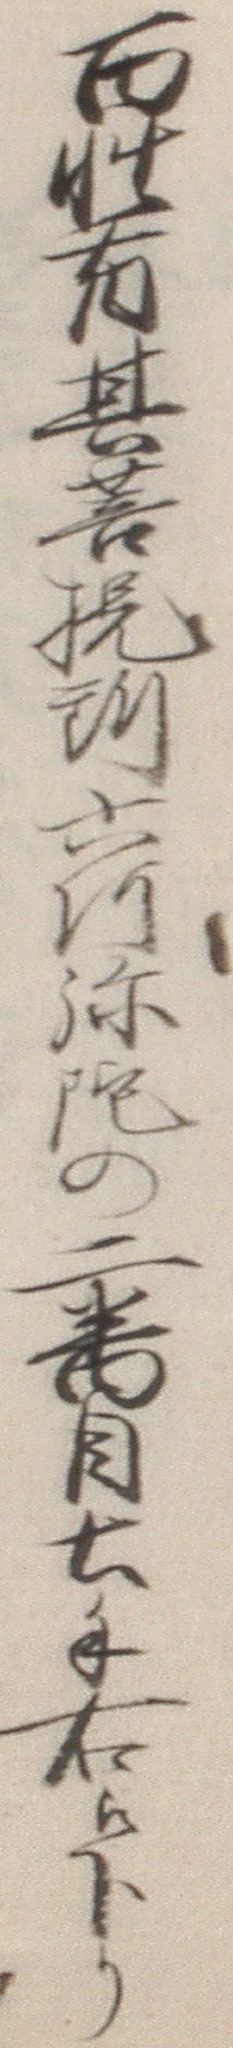百姓有其菩提所六阿弥陀の二番目土手右え下り
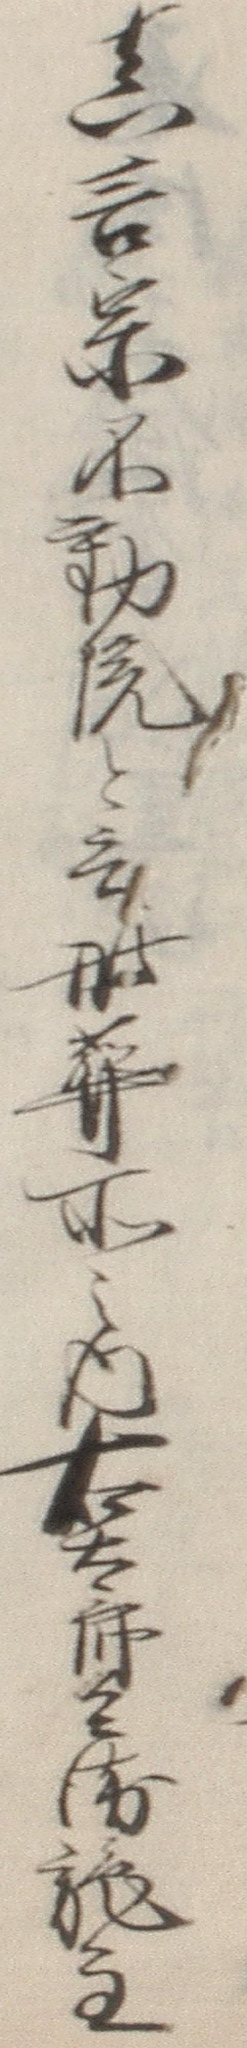真言宗不動院と云此葬所之内右太郎兵衛施主
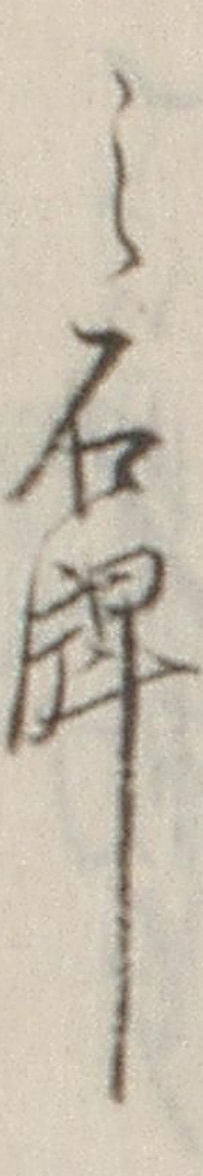之石碑
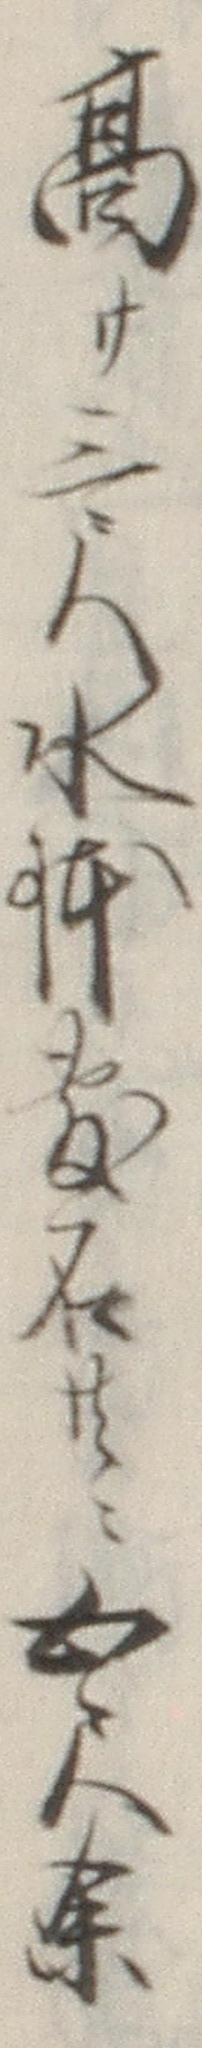高サ三尺水鉢敷石共ニ五尺余
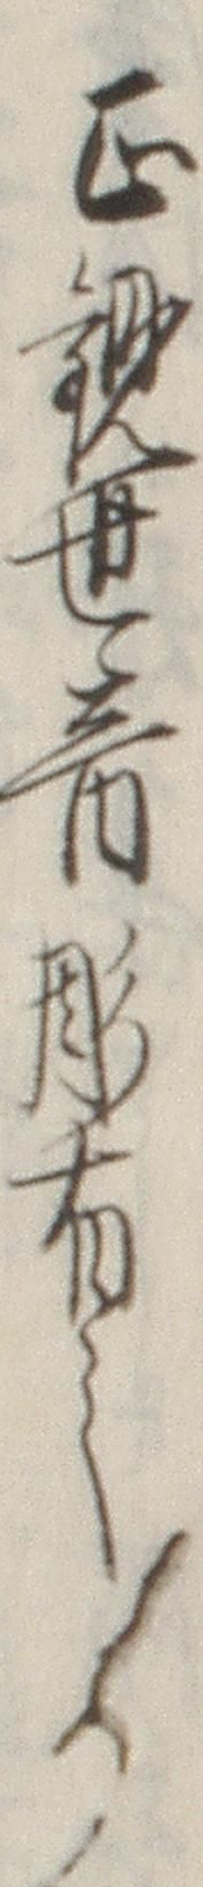正観世音彫有候
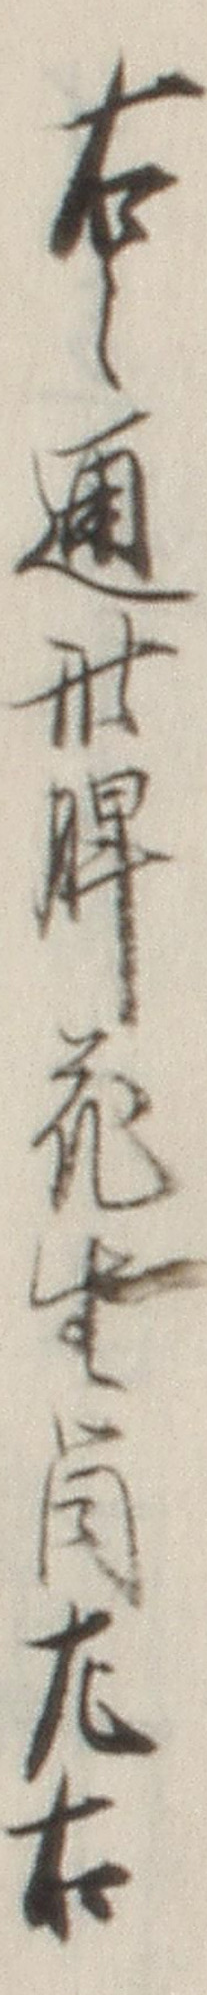右の通此碑花生筒左右
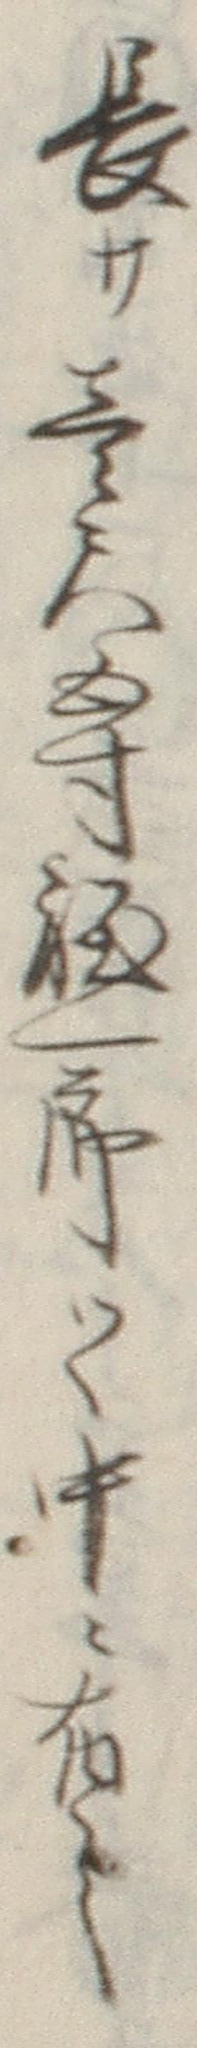長サ壱尺五寸程一節ツヽ中ニ有之

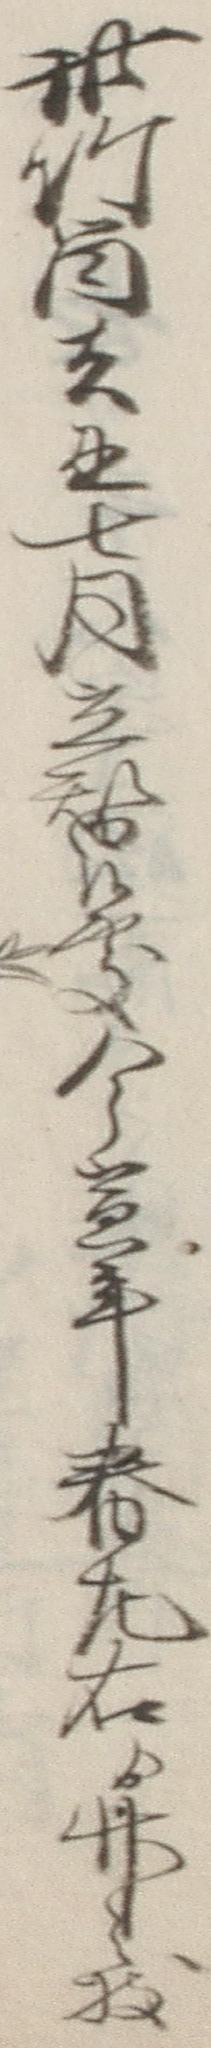此竹筒去丑七月立替候処今寅年春左右ゟ竹々の枝
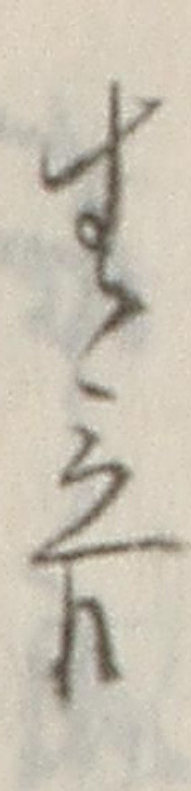生立候
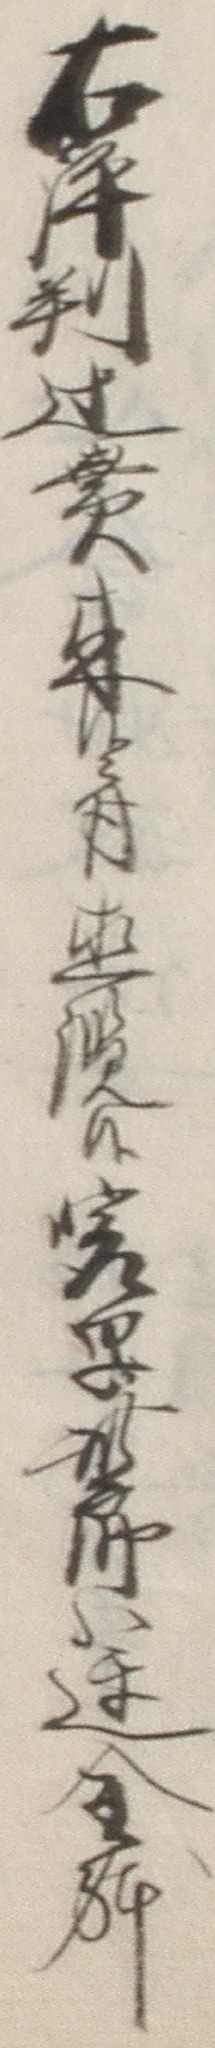右評判辻売来候ニ付直覧候最早此節ハ造全躰
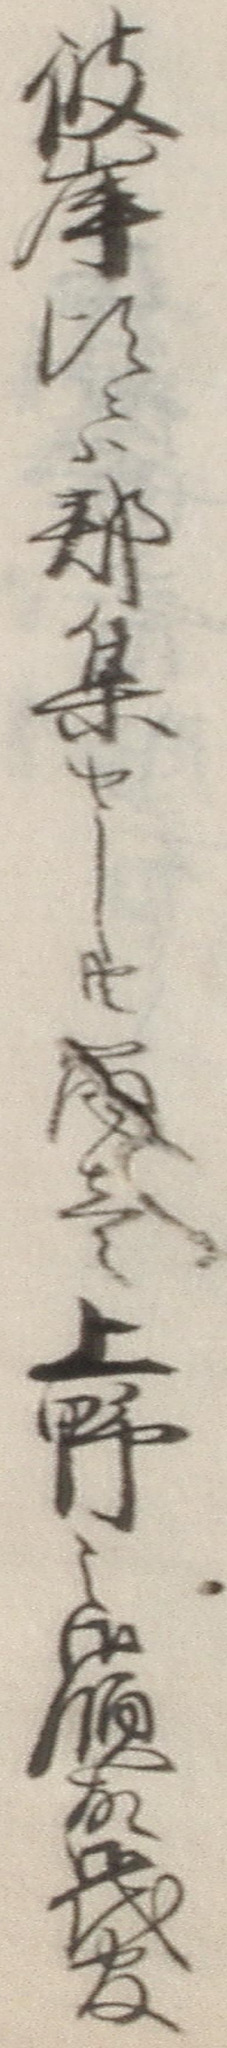彼岸頃ニハ群集申候由筒壱上野御領故御代官
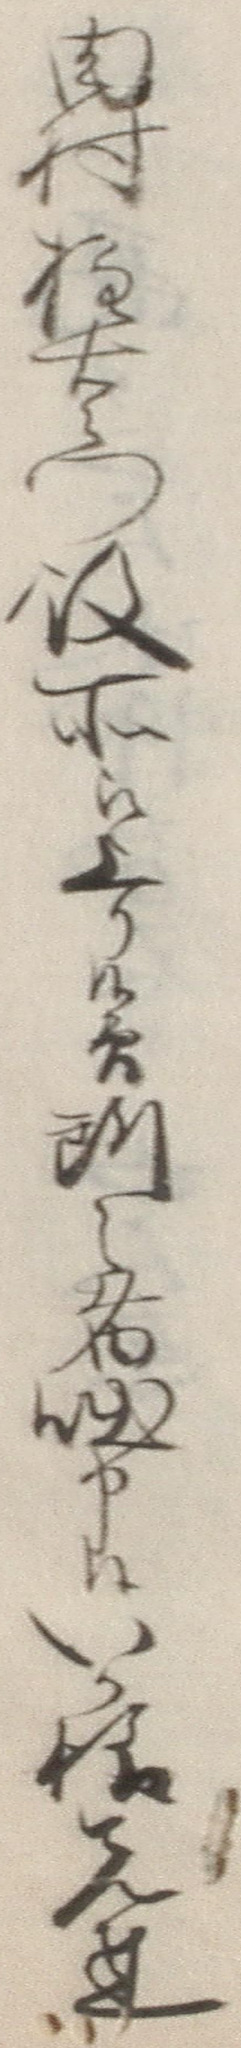内村権右衛門役所え上り候而ハ所の者昢申候いか様先達
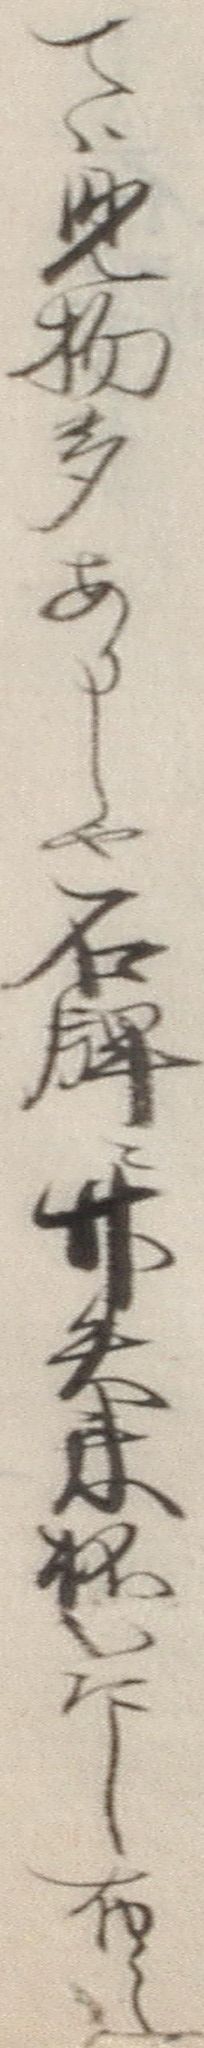てハ見物多あり候や石碑ニ竹矢来抔いたし有之
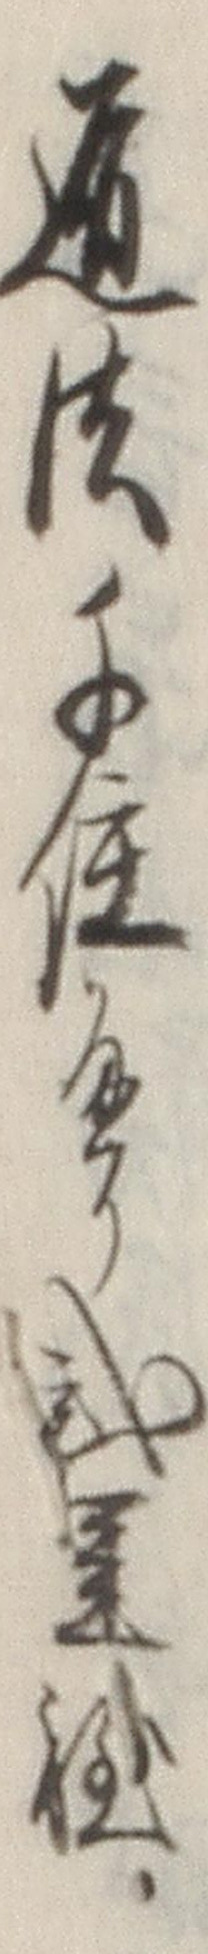道法千住通り弐里程
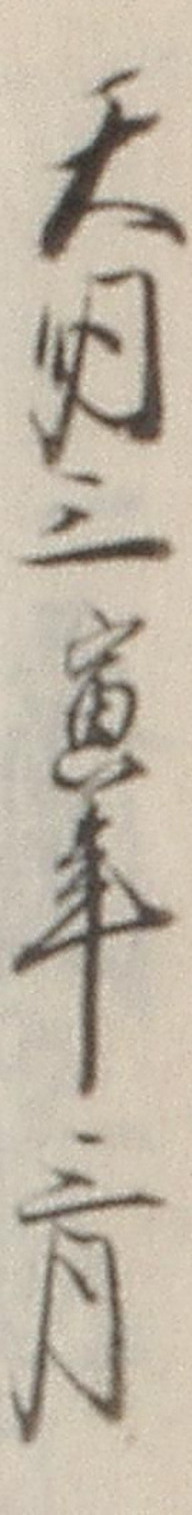天明三寅年三月
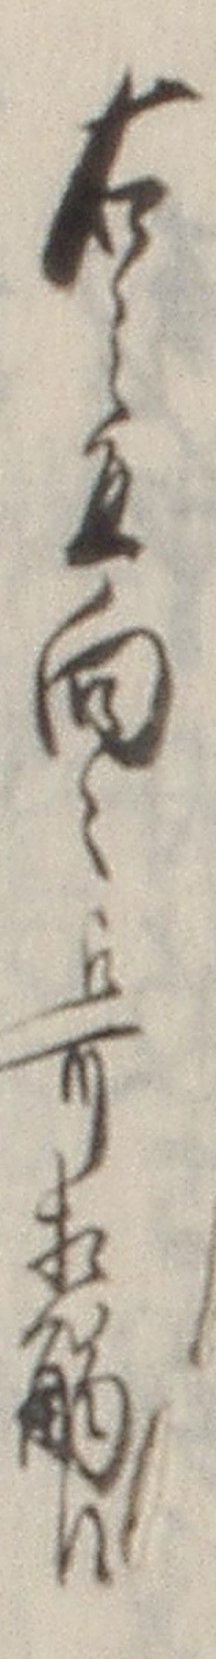右之通向々江可相触候
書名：[諸国災害記録]
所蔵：東京大学地震研究所図書室 Earthquake Research Institute Library, The University of Tokyo, JAPAN
